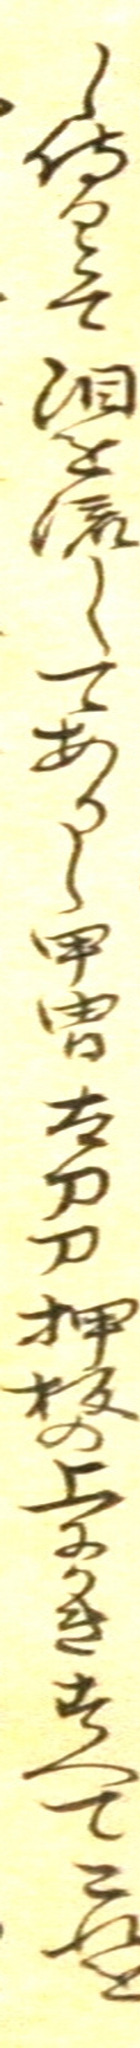し侍るとて泪を流してありし甲冑太刀刀押板の上にかきすへてこれを
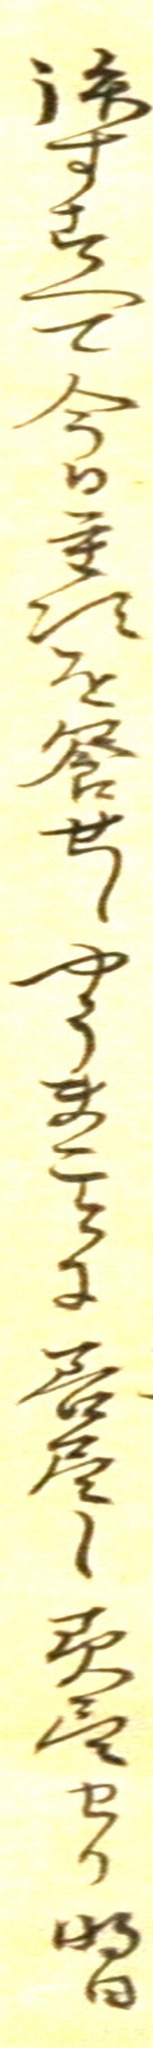拝すすへて今日重次を饗せしやうまことに善尽し美尽せり明日

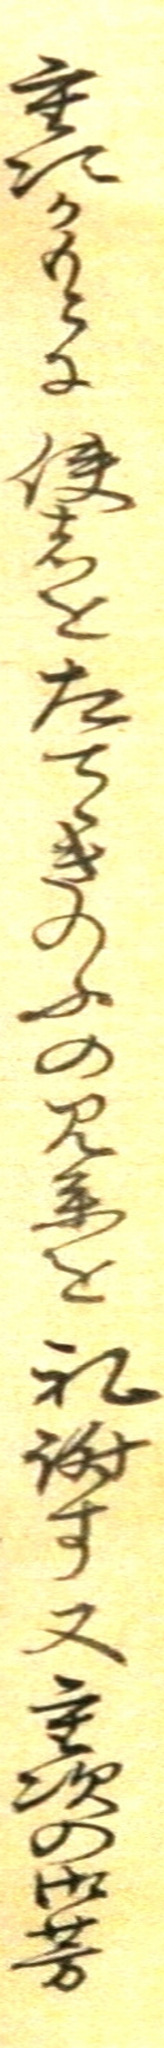重次かもとに使者をたてゝきのふの見参を礼謝す又重次の御芳
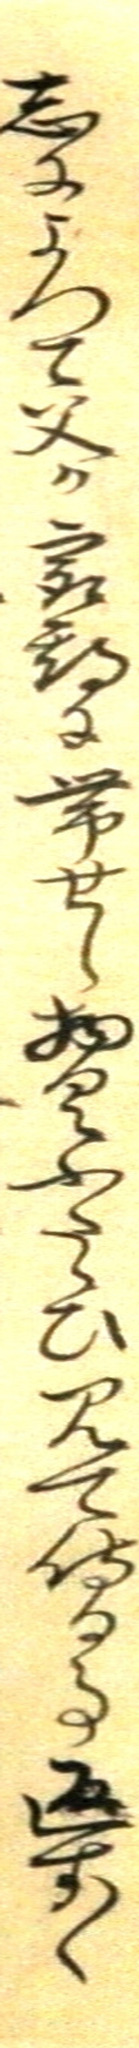志によつて父か最後に帯せし物具ふたゝひ見て侍る事返す〳〵
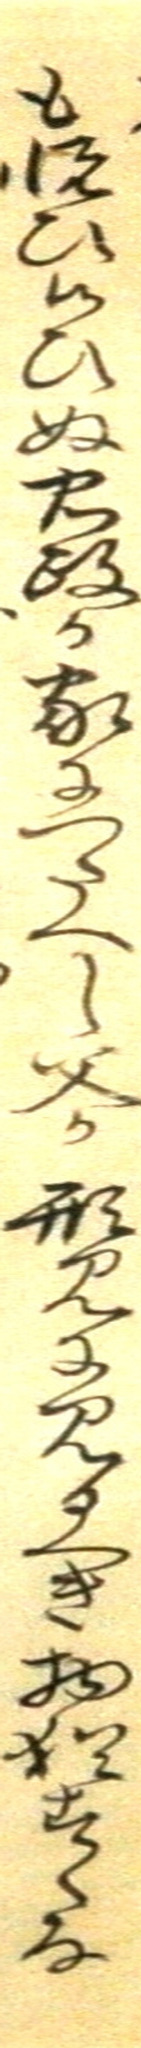も悦ひ候ひぬ忠政か家につたへし父か形見に見るへき物猶すくな
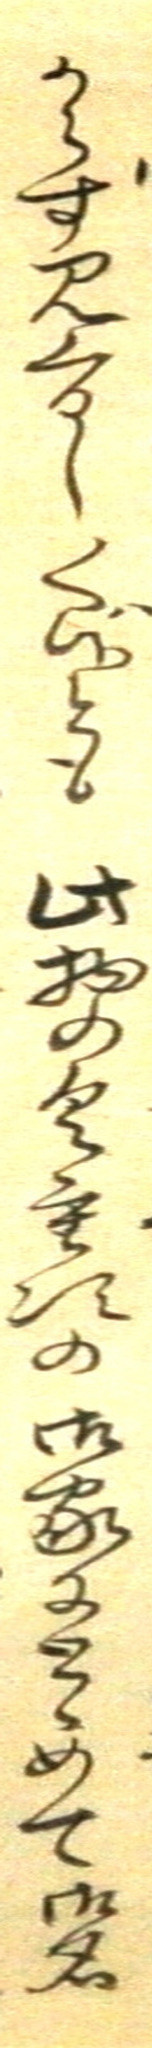からす見くるしくは候とも此物の具重次の御家にとゝめて御名
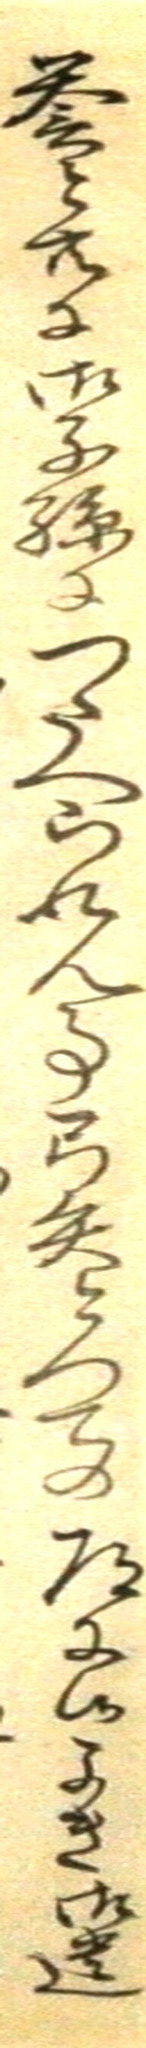誉と共に御子孫につたへられん事弓矢とつての道に候よき御遺
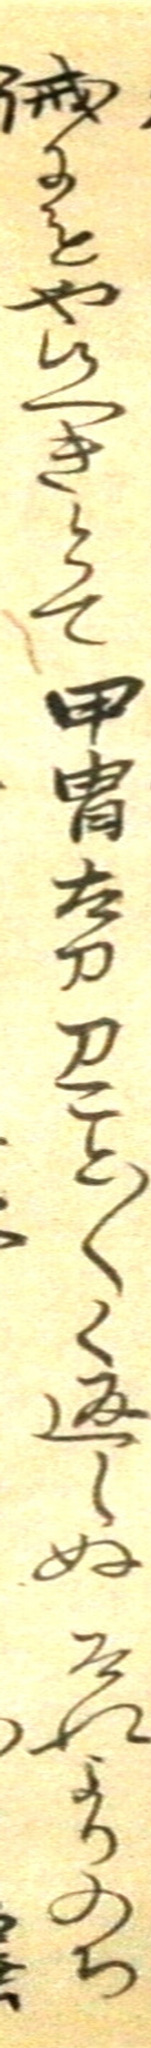誡にもや候へきとて甲冑太刀刀こと〳〵く返しぬそれよりのち
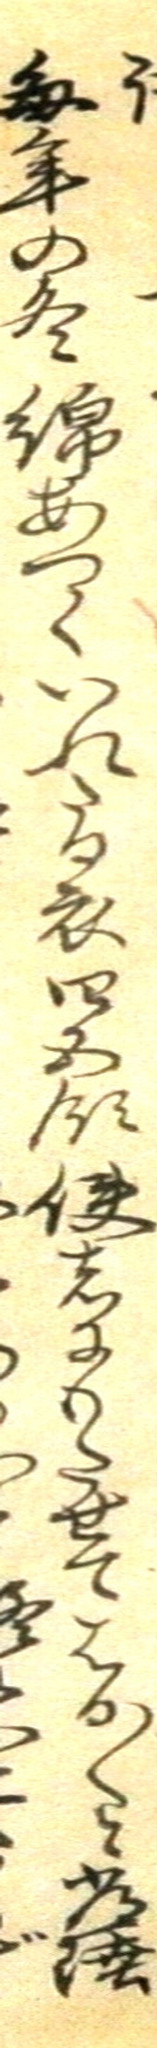毎年の冬綿あつくいれたる衣四五領使者にもたせてはる〳〵と常陸
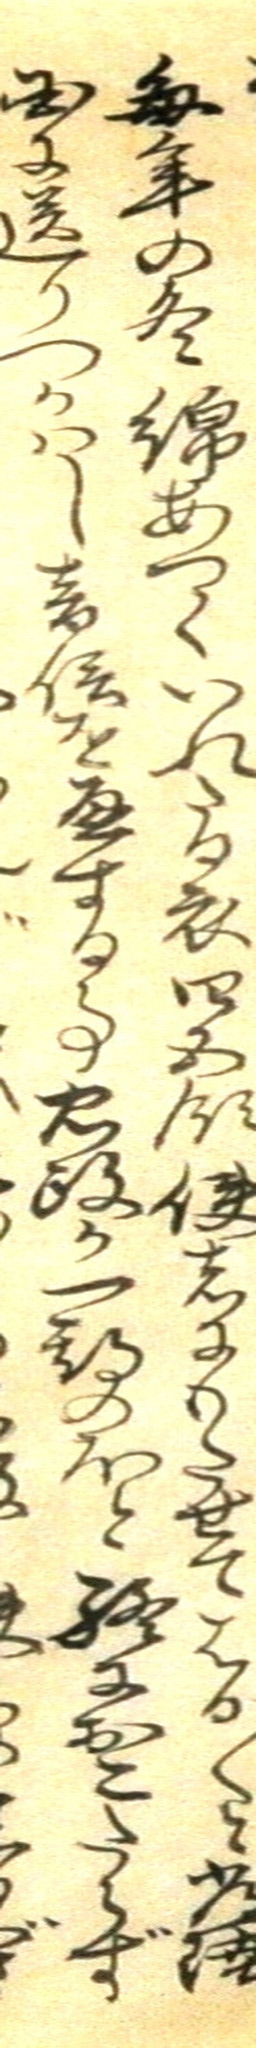国に送りつかはし音信を通する事忠政か一期のほと終におこたらず
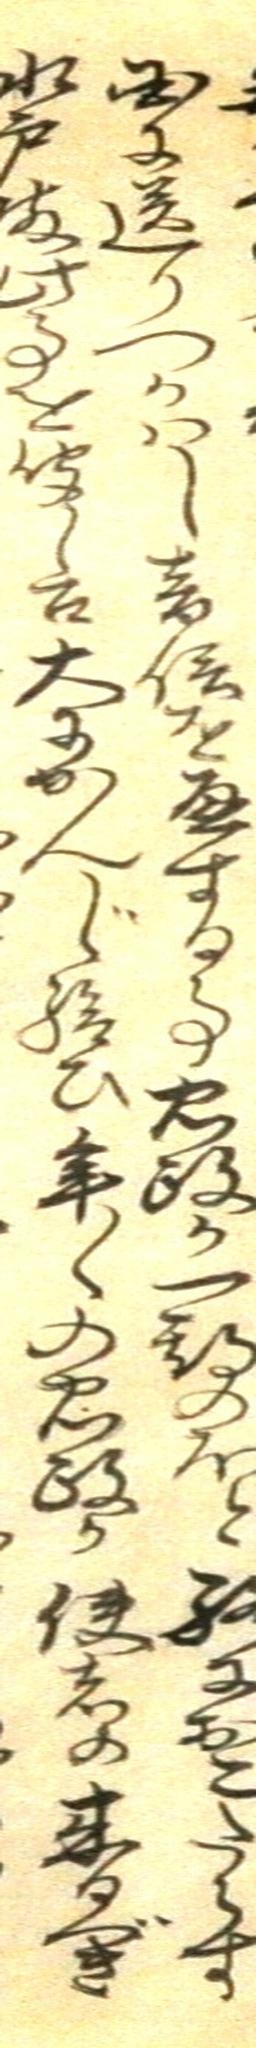水戸殿此事を聞し召大にかんじ給ひ年〳〵の忠政か使者の来るべき
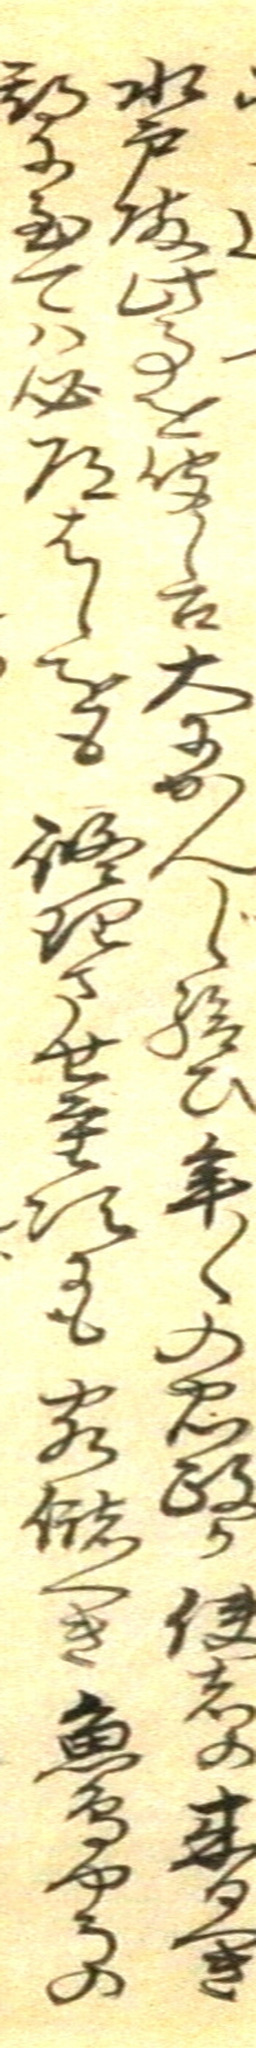期に至ては必道はしをも修理させ重次にも客儲へき魚鳥やうの
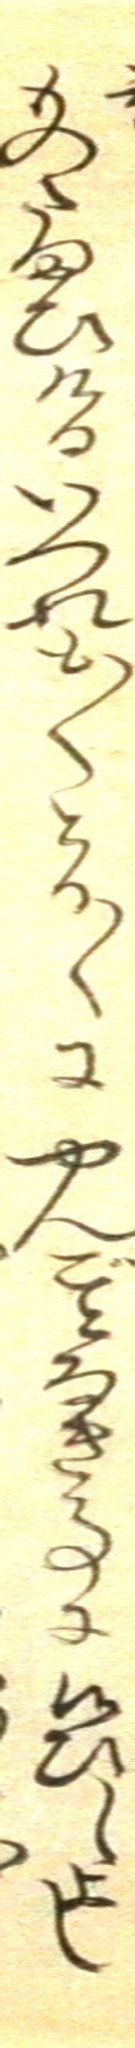ものたまひけるいつれも〳〵とり〳〵にやんごとなき事に候ひしよし
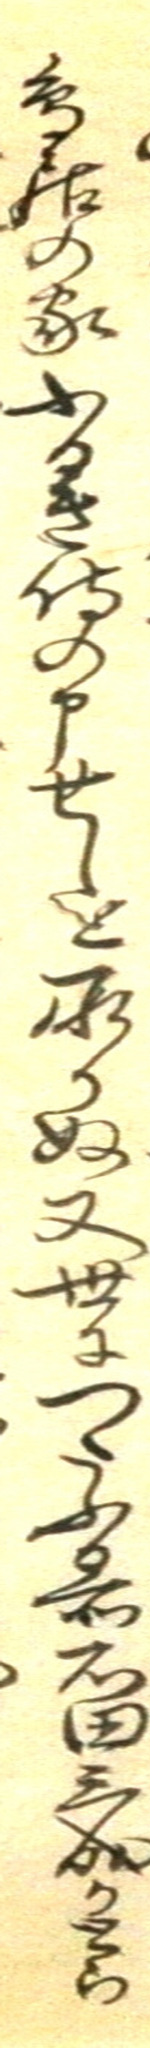鳥居の家ふるき侍の申せしを承りぬ又世につたふる所石田三成かとら
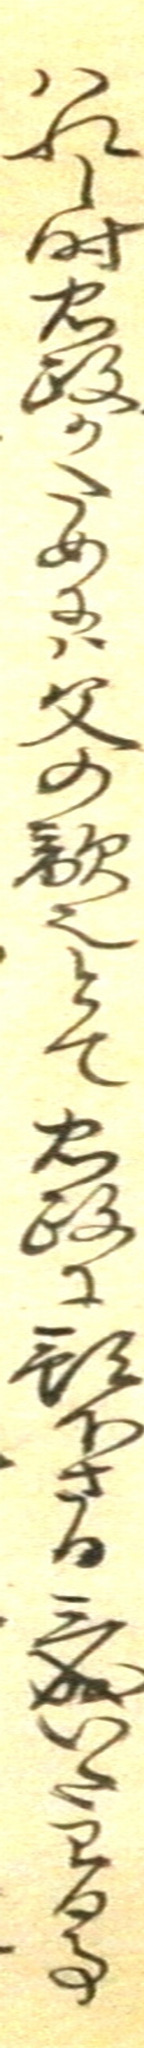はれし時忠政かためには父の敵也とて忠政に預下さる三成いたわる事
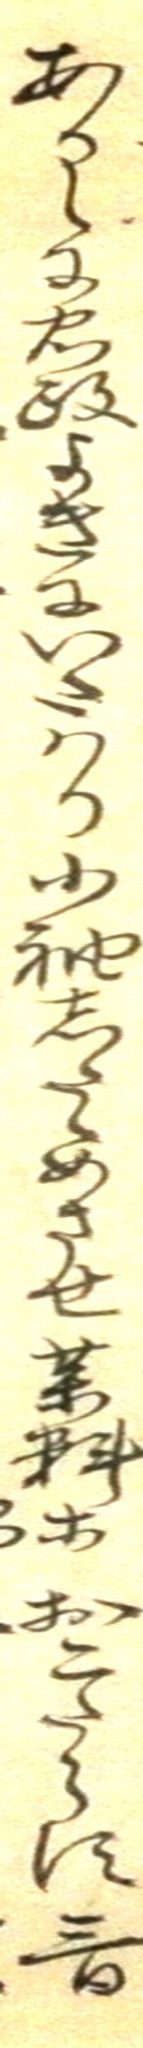ありしに忠政よきにいたはり小袖したゝめさせ薬料等おこたらす三日
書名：藩翰譜（四・中）
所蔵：伊那市立高遠町図書館・合同会社AMANE
